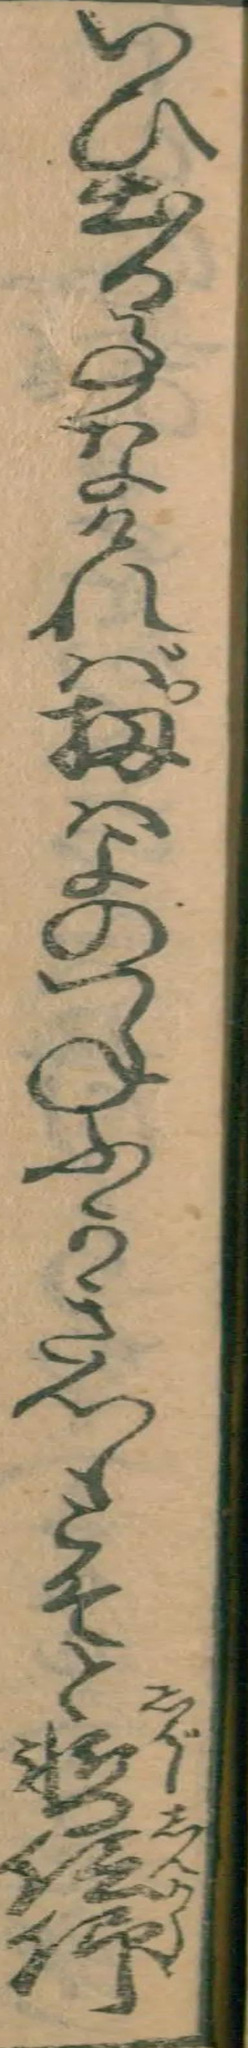いひ出る事なかれば。扨はよのつねふかき心もこそと暫信仰
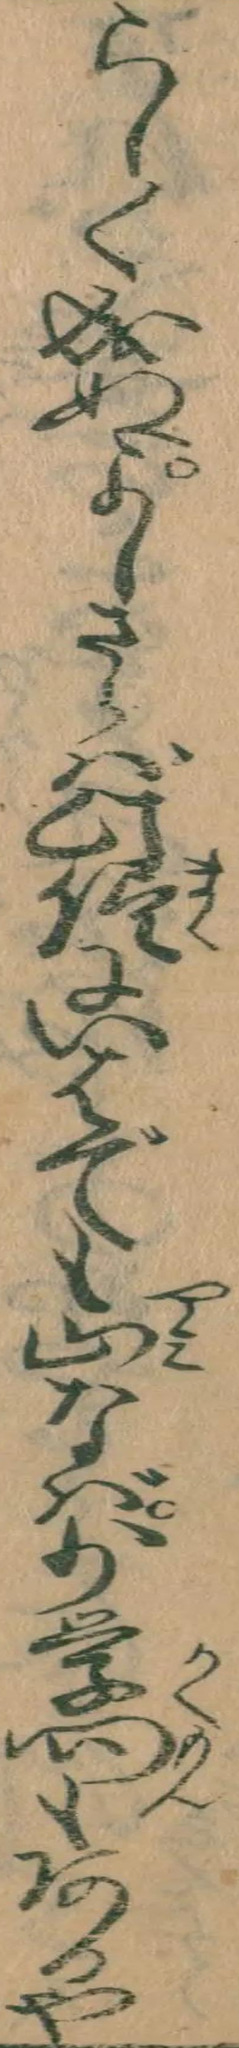らしく成ぬ。よしさらば此侭にいはでも止なば。少学問あるや
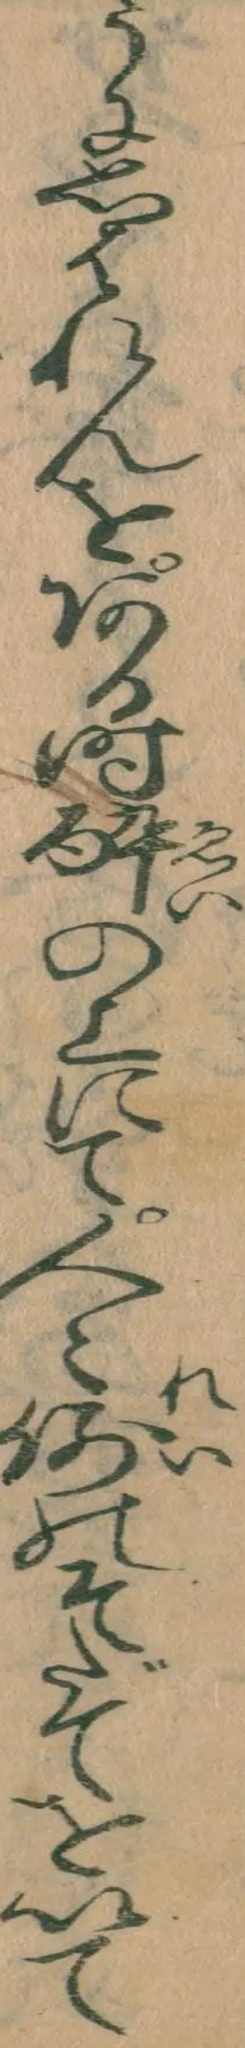うに思はれんを。ある時酔の上にて。人々例のそだてを以て
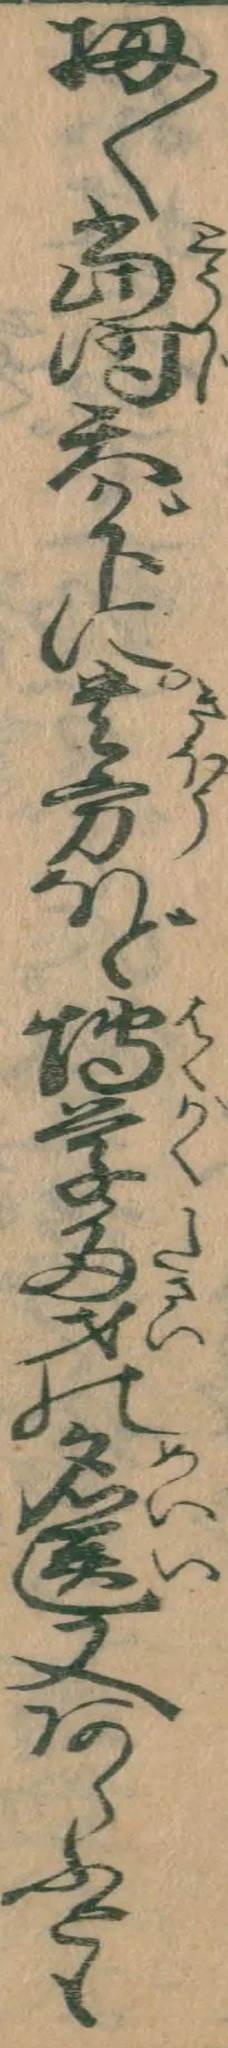扨々当時天が下に。貴方ほど博学多才の名医又あらふとも
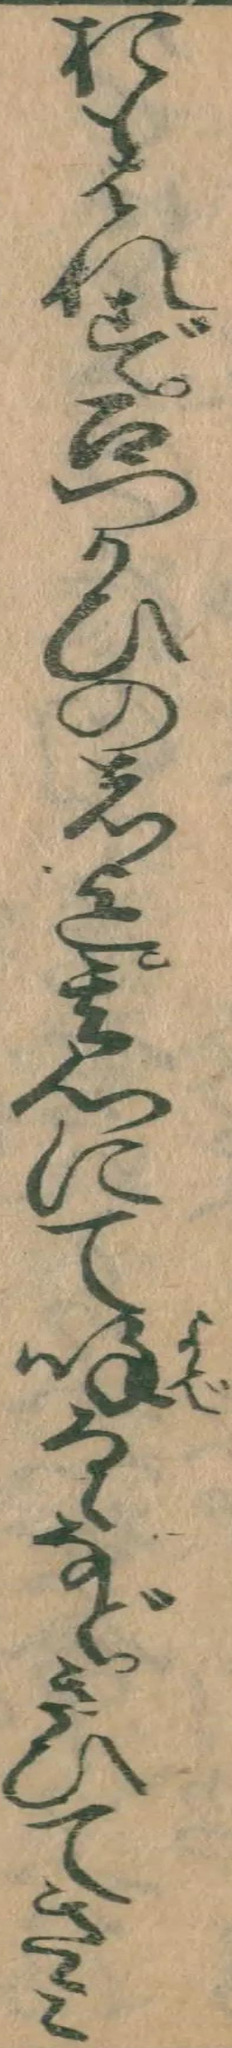おもはれず。召つかひの者迄。其心にて呼るゝなど。きひてきみ
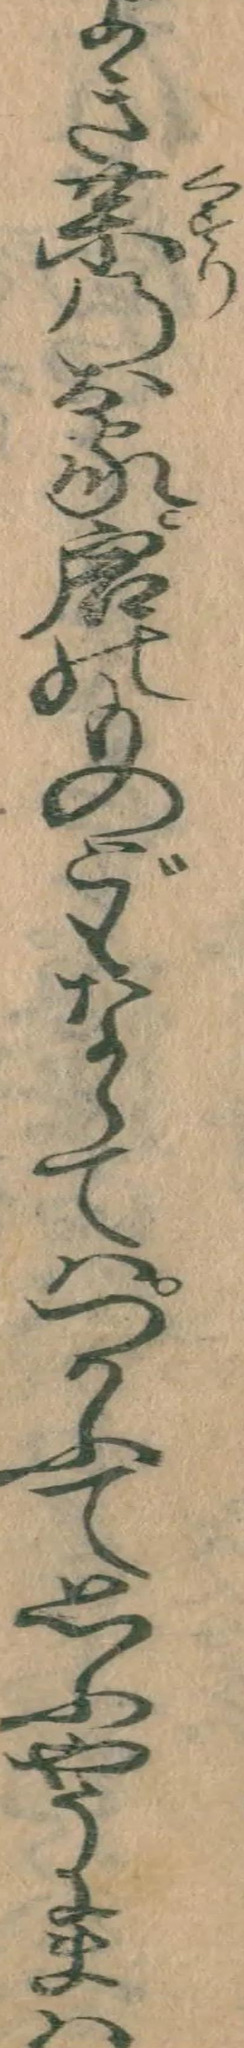よき薬のお家。唐のものどもならては。つかふて思ふやうにまは
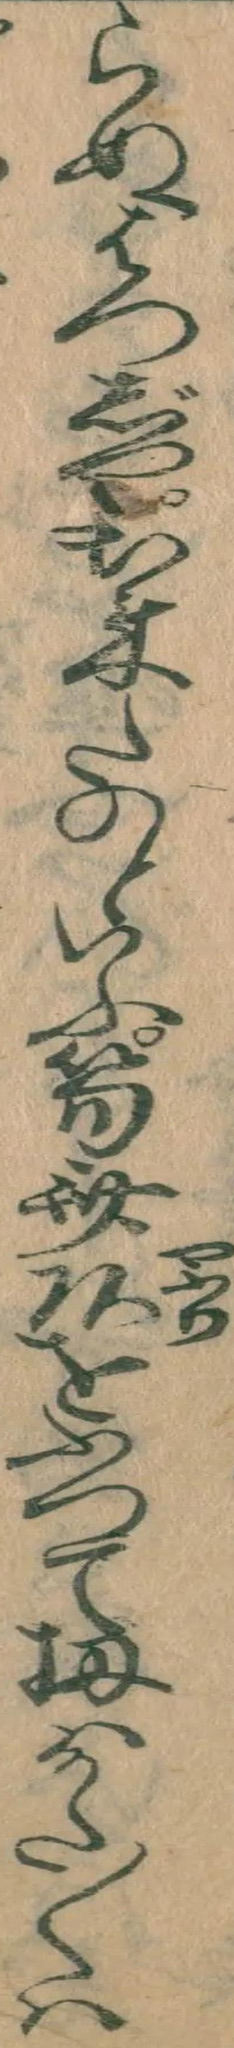らぬはつじや。出来たのといふ。筍斎頭をふつて扨はかた〳〵は
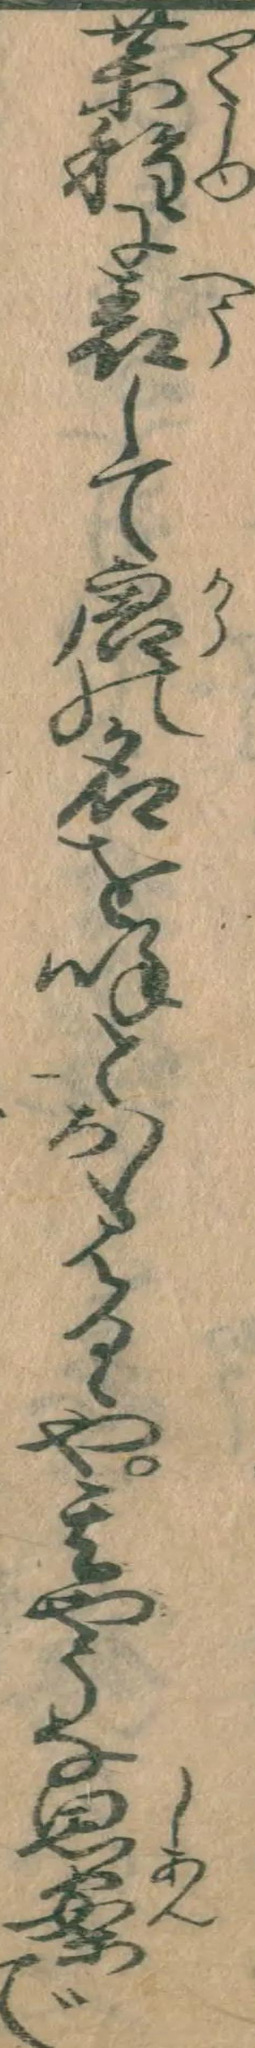薬種に表して唐の名を呼とおしはるゝや。其やうな思案で
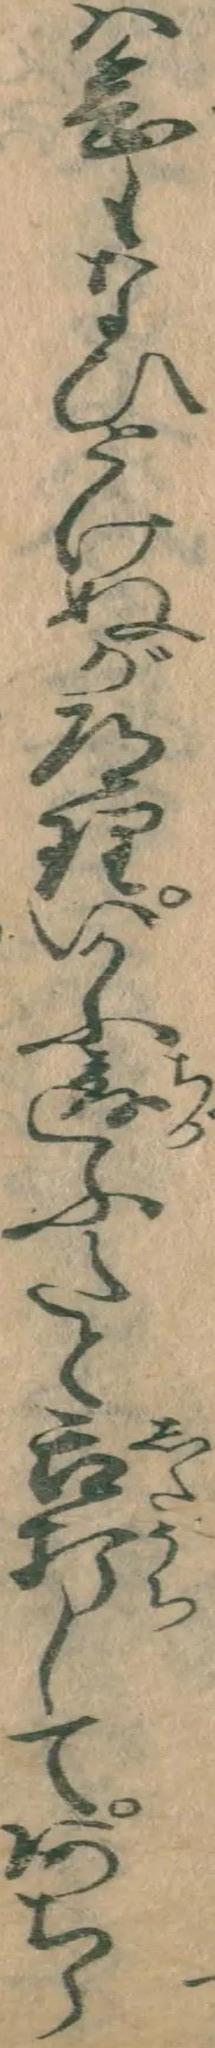は念もなひとけぬが道理。いかに違ふたと舌打して。あちら
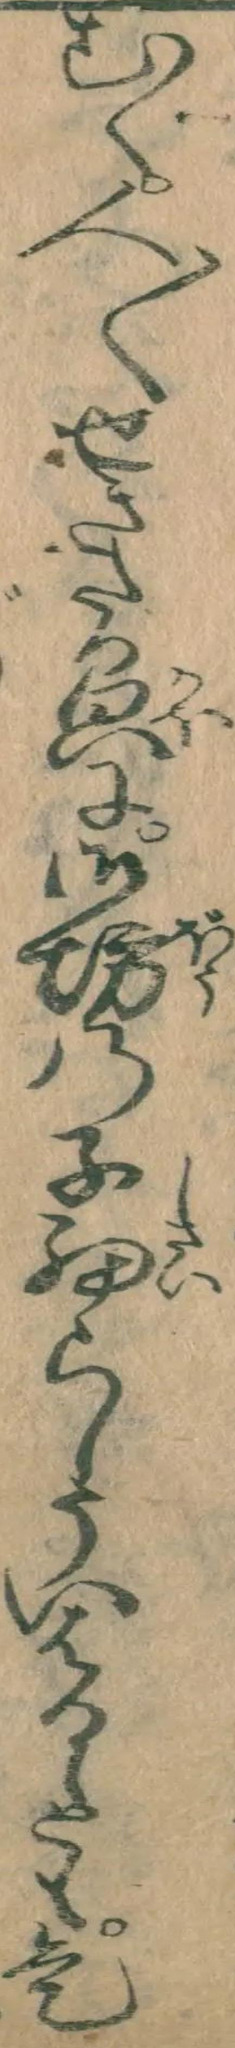むく。人々せきたる貌に。御坊の子細らしういはるゝとも。是
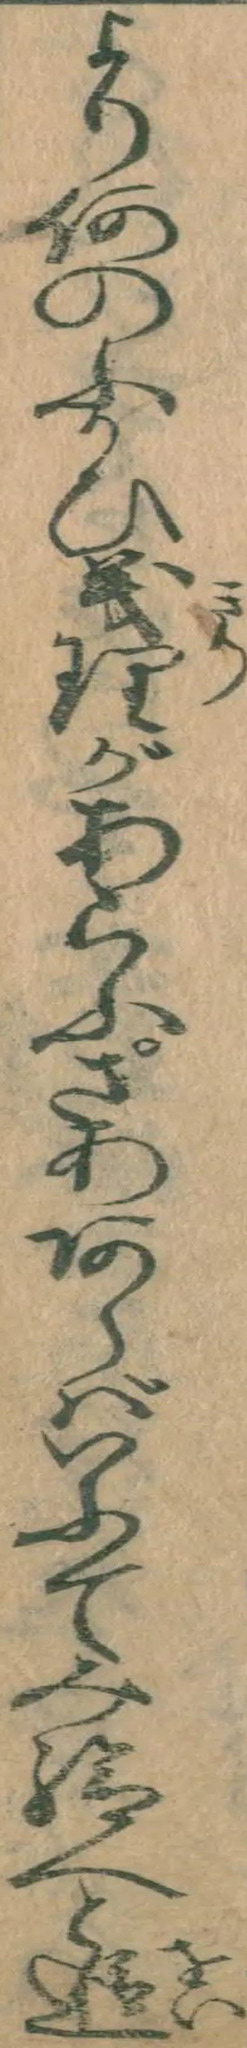より何のふかひ義理があらふ。さああらばいふてみ給へと追

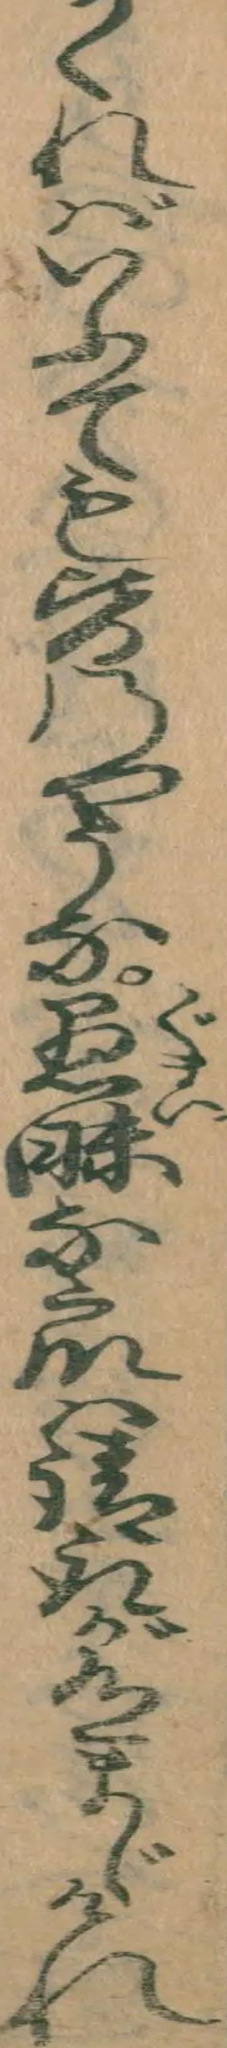かくればいふても皆のやうな。愚昧な衆は請取が有まじけれ
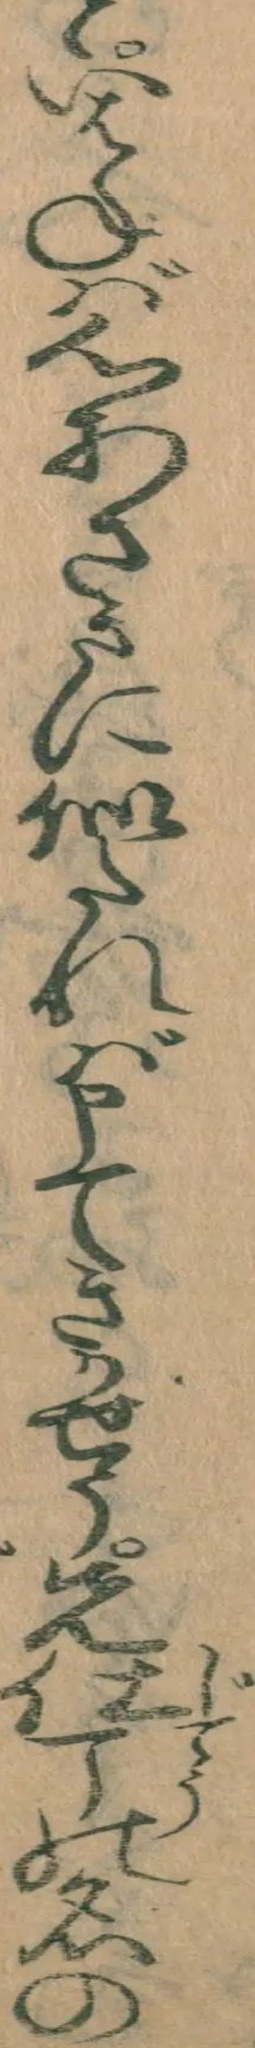ど。いはねば心あさきに似たれば申てきかせう。先仕丁の名の
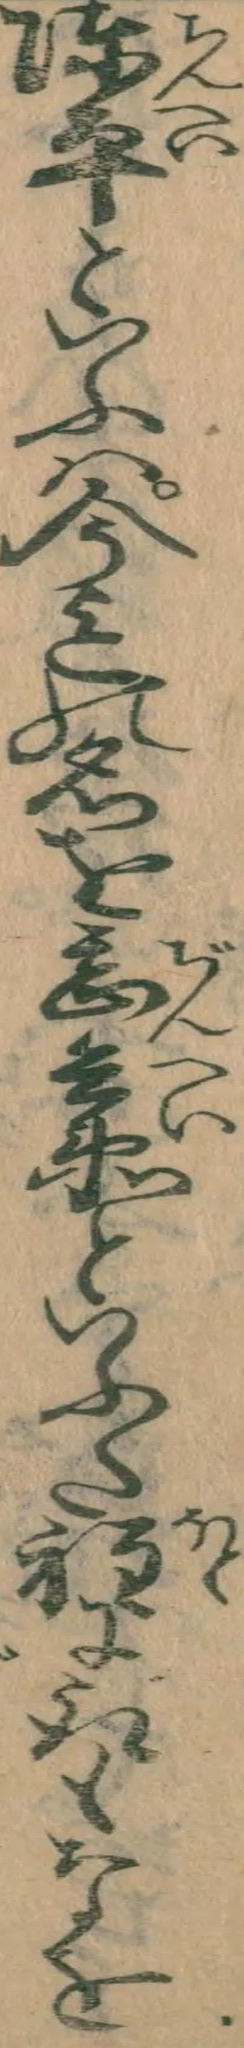陳平といふは。今迄の名を甚兵衛といふた程に取もなを
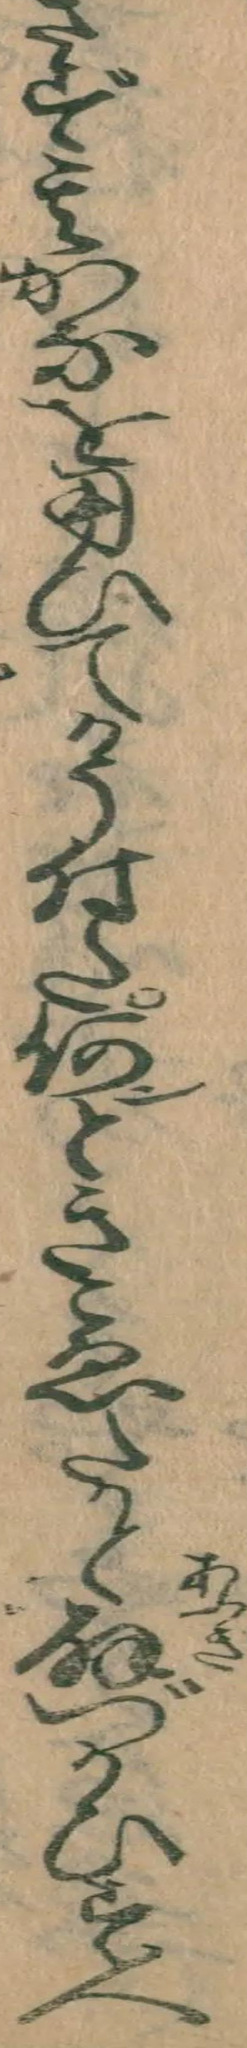さず其かなを用ひてかう付た。何扇づかひす人
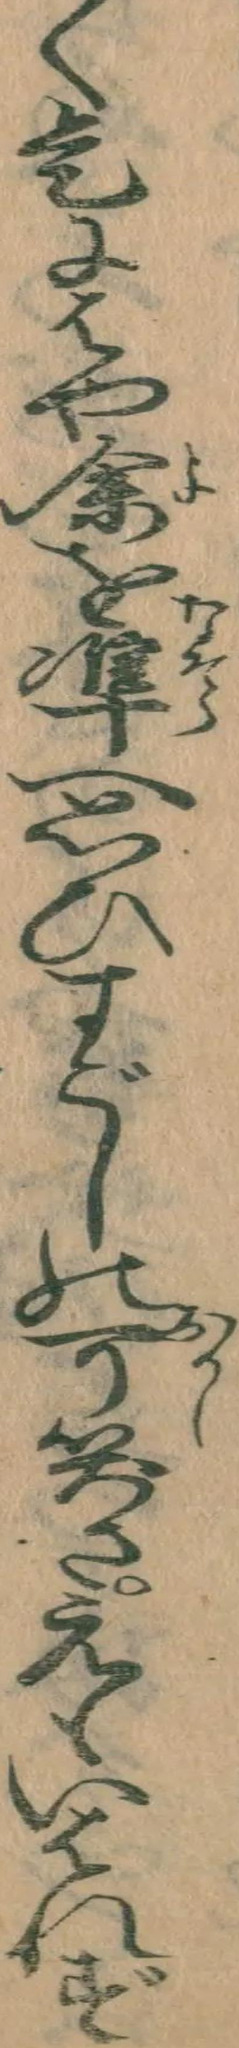々是にはや余を準へ思ひすごしの可笑さ。えもいはれず
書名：新竹斎 5巻
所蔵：国立国会図書館 National Diet Library, JAPAN
